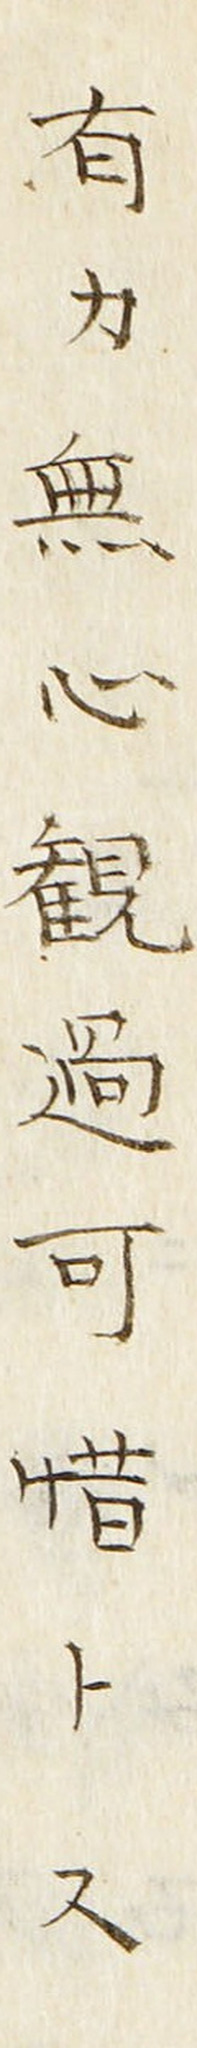有カ無心観過可惜トス
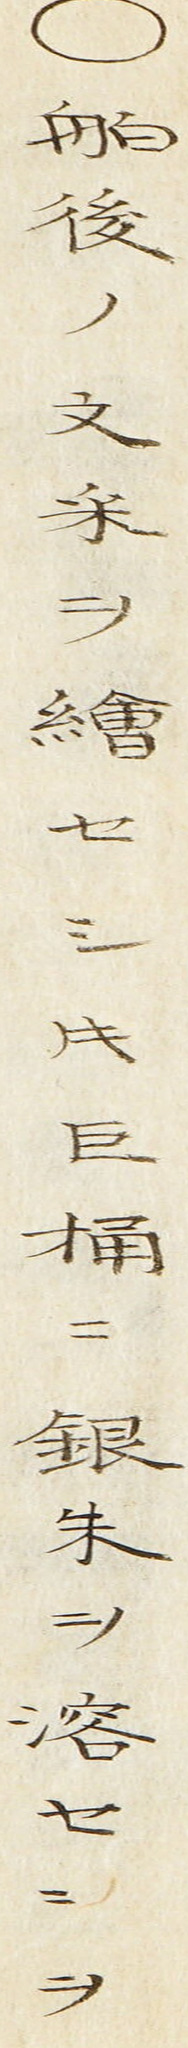〇舶後ノ文采ヲ繪セシトキ巨桶ニ銀朱ヲ溶セシ？ヲ
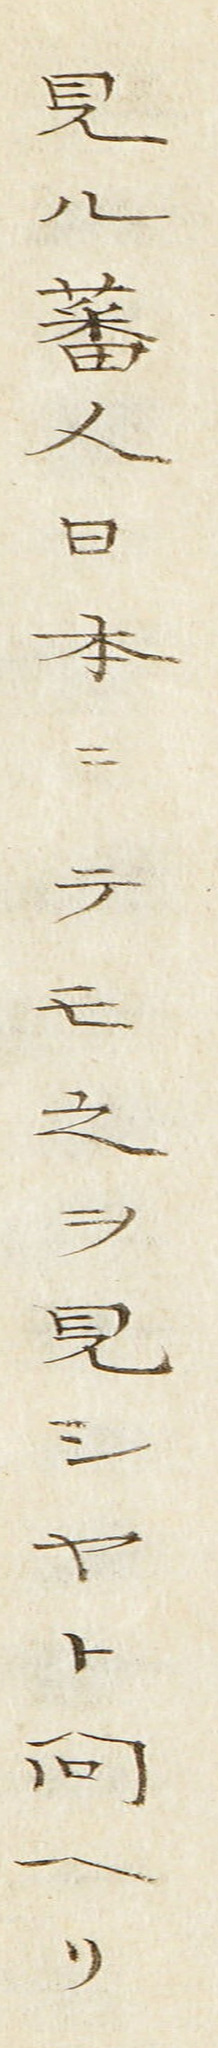見ル蕃人日本ニテモ之ヲ見シヤト問ヘリ
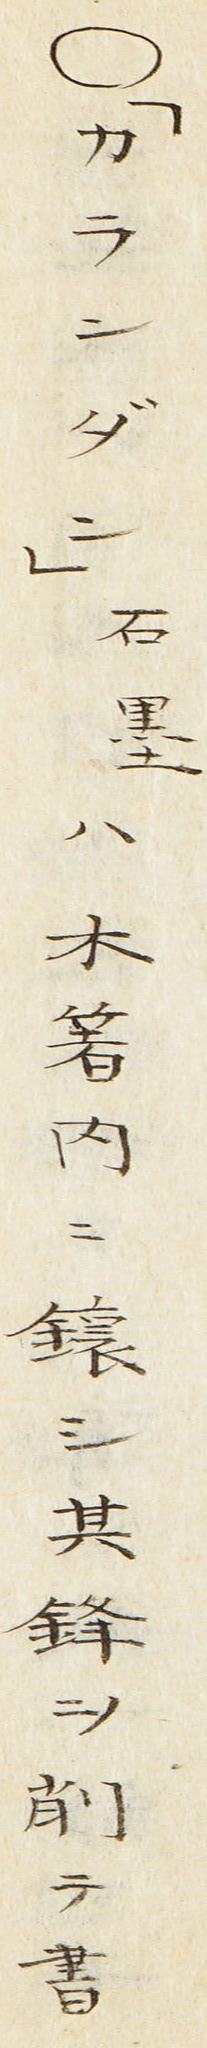〇「カランダン」石墨ハ木箸内ニ鑲シ其鋒ヲ削テ書

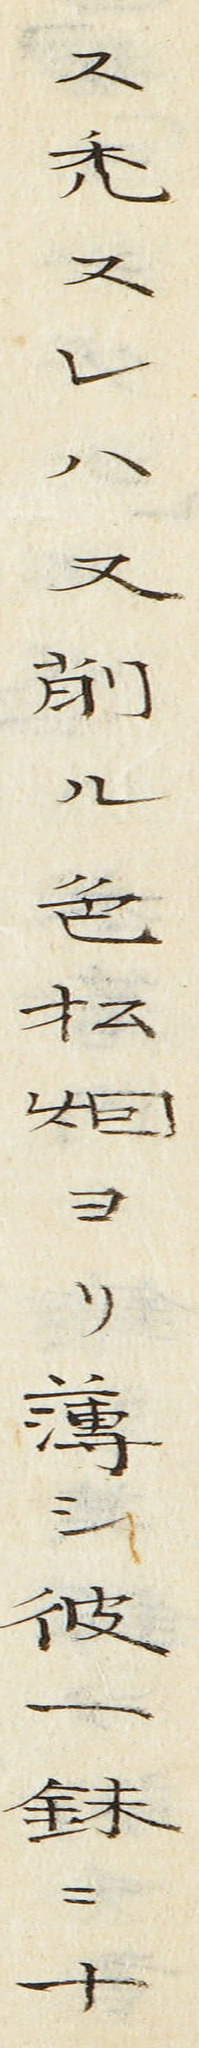ス禿スレハ又削ル色松烟ヨリ薄シ彼一ニ十
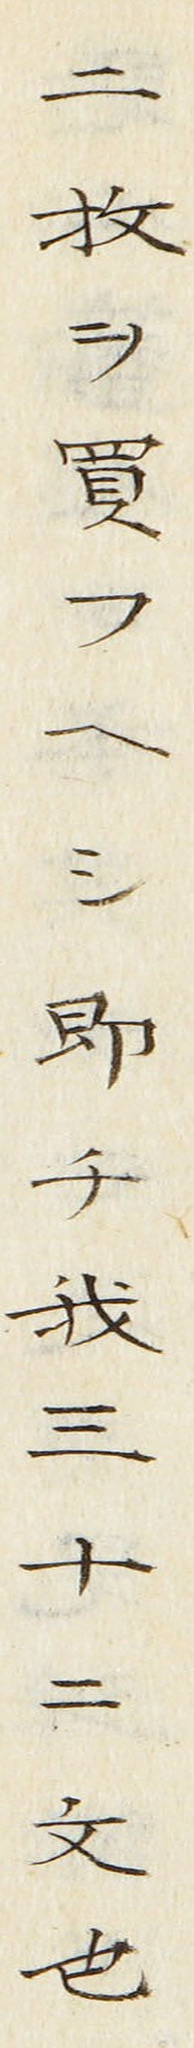ニ枚ヲ買フヘシ即チ我三十二文也
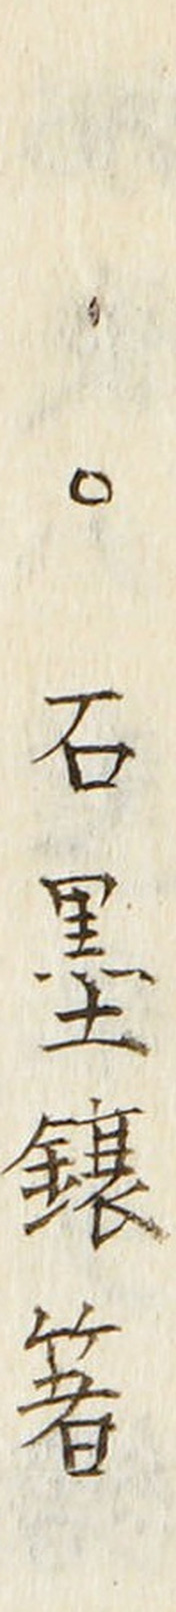〇石墨鑲箸
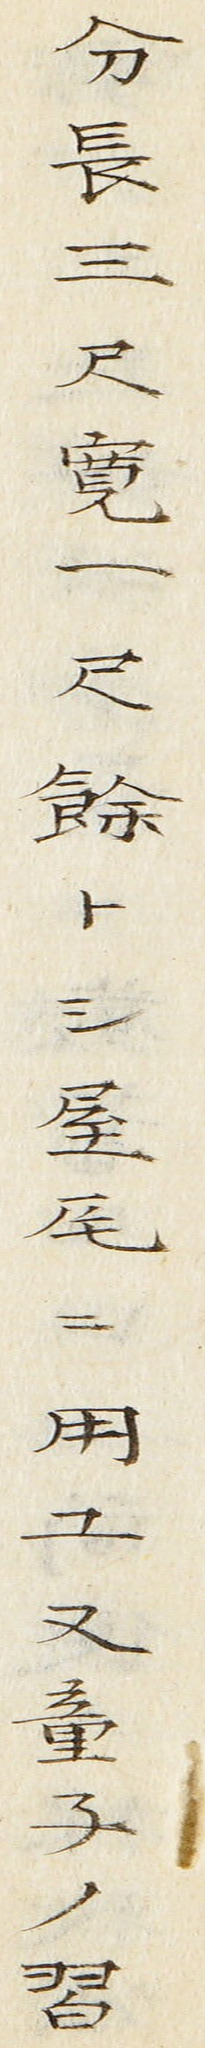分長三尺寛一尺余トシ屋尾ニ用ユ又童子ノ習
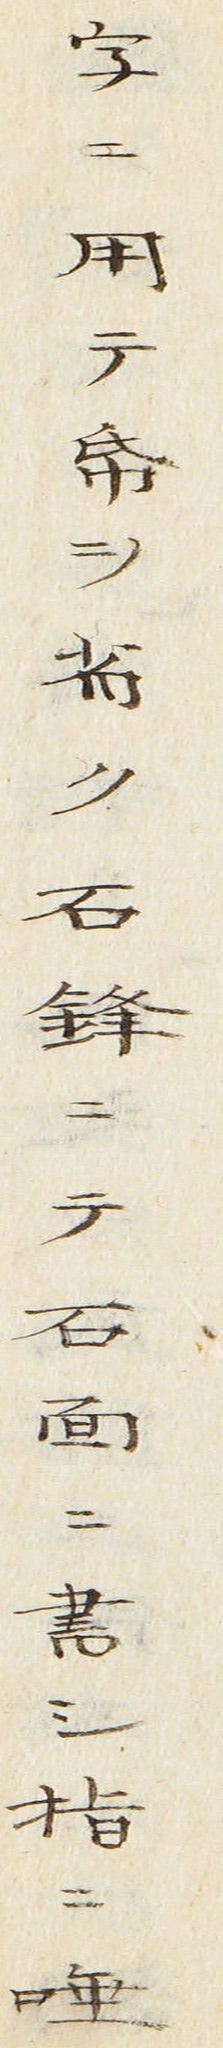字ニ用テ帋ヲ省ク石鋒ニテ石面ニ書シ指ニ唾
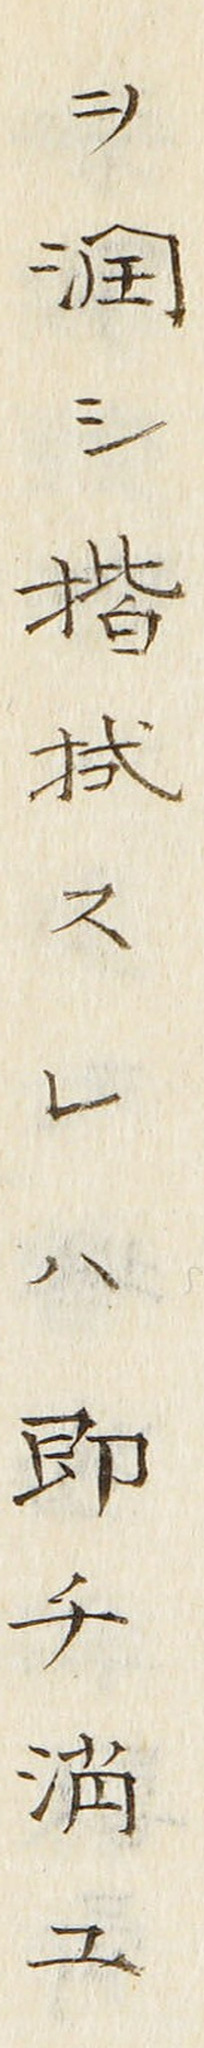ヲ潤シ揩拭スレハ即チ消ユ
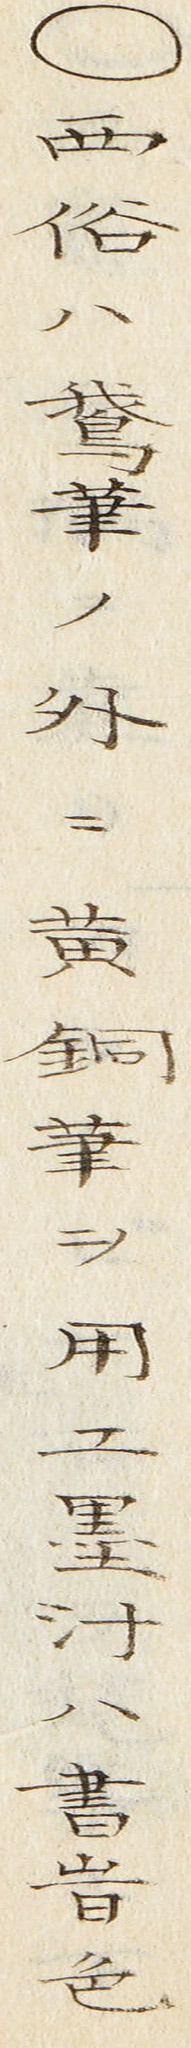〇西俗ハ鵞筆ノ外二黄銅筆ヲ用ユ墨汁ハ書旹色
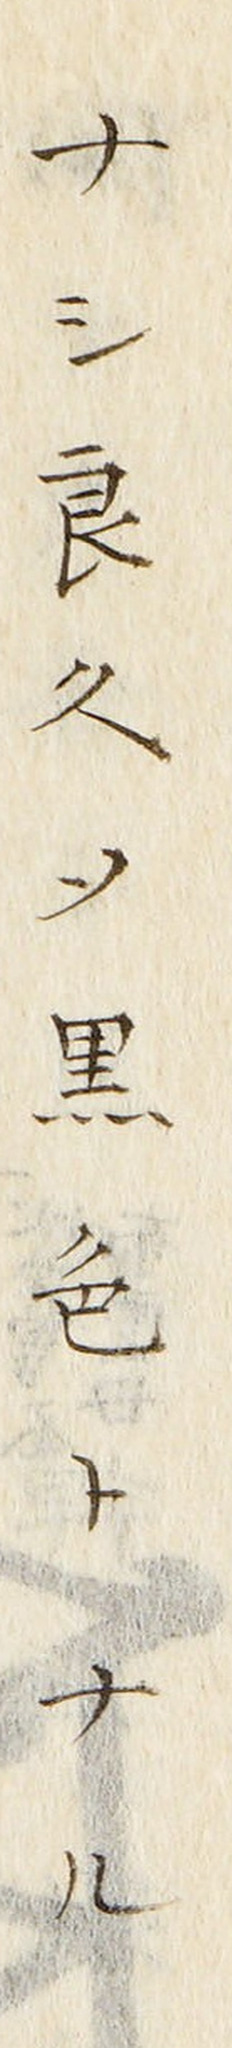ナシ良久シテ黒色トナル
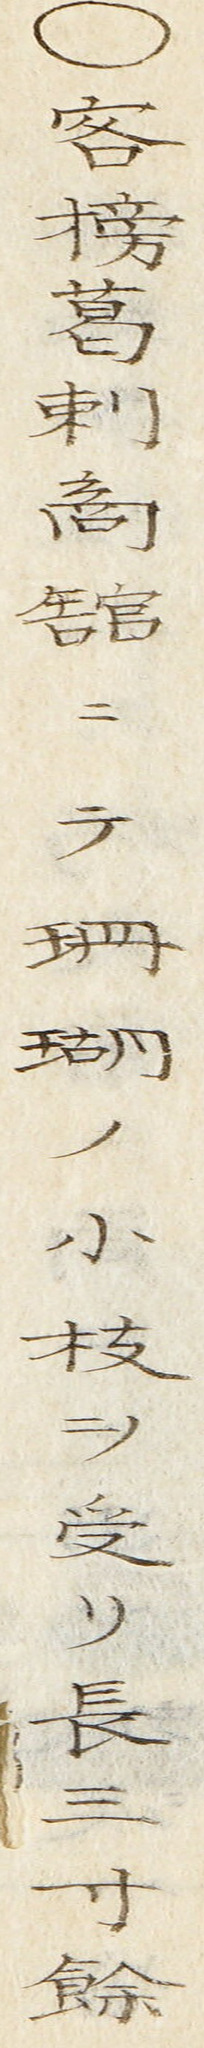〇客榜葛刺商館ニテ珊瑚ノ小枝ヲ受リ長三寸余
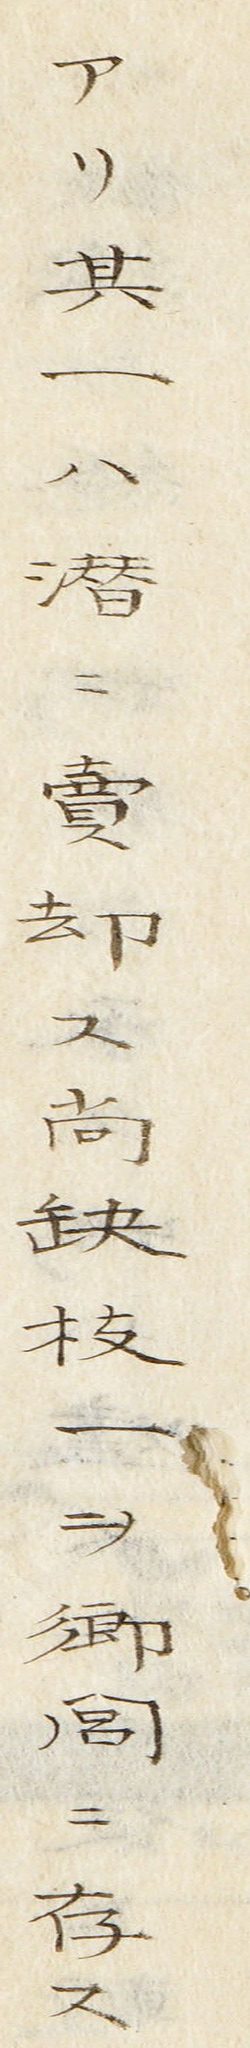アリ其一ハ潜二売却ス尚缺枝一ヲ郷閭ニ存ス
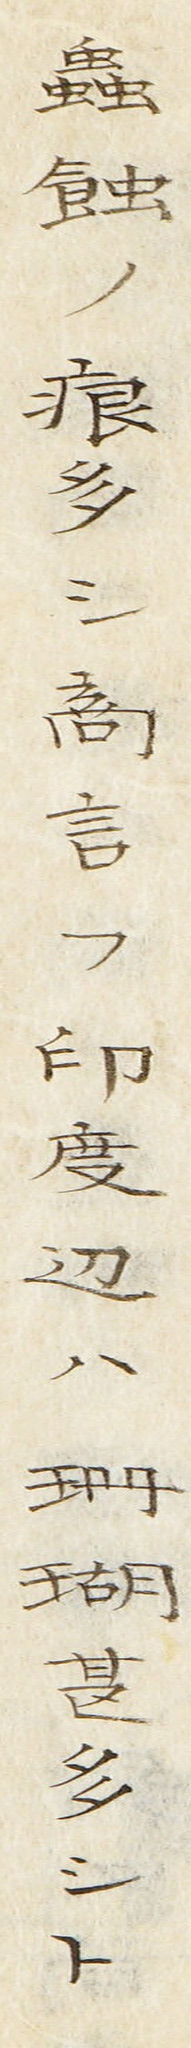蟲蝕ノ痕多シ商言フ印度辺ハ珊瑚甚多シト
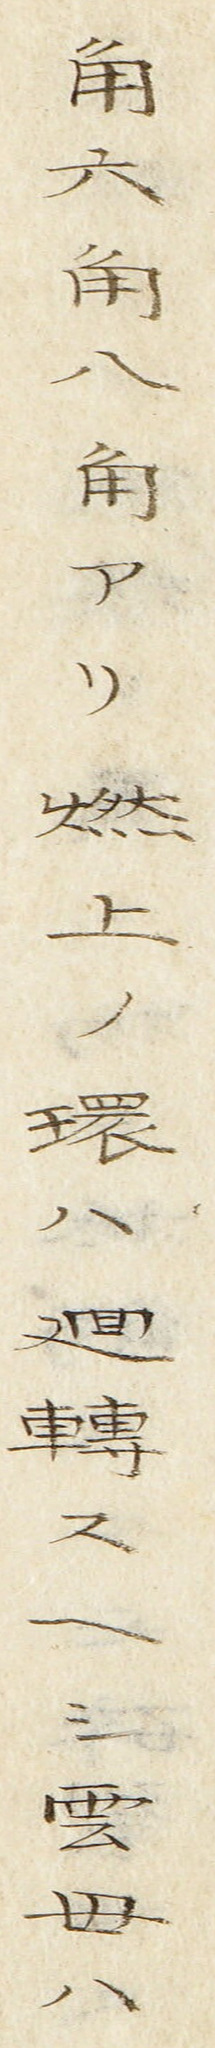角六角八角アリ燃上ノ環ハ廻轉スヘシ雲母ハ
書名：蕃談
